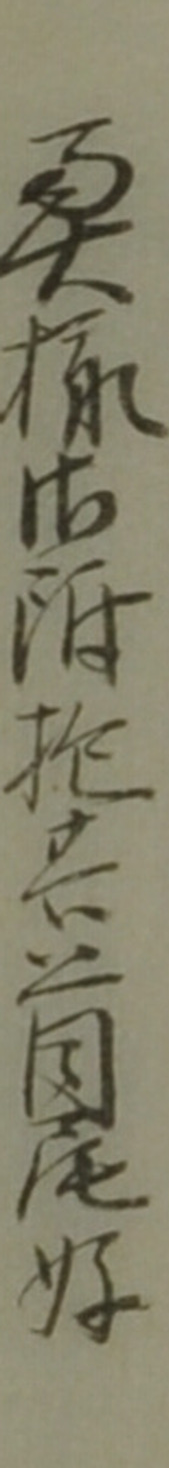奥様御附抱共首尾好
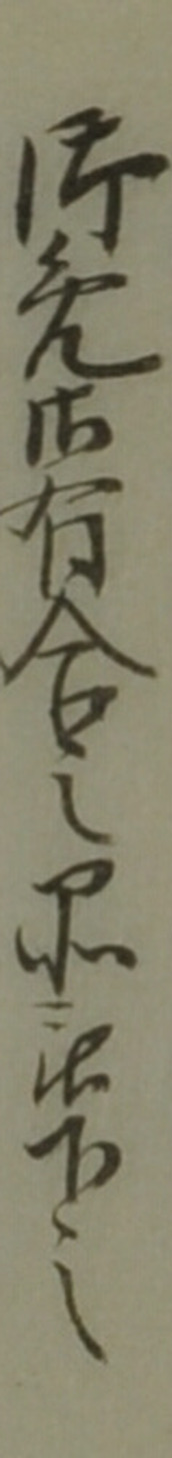御免御有含之品被下之
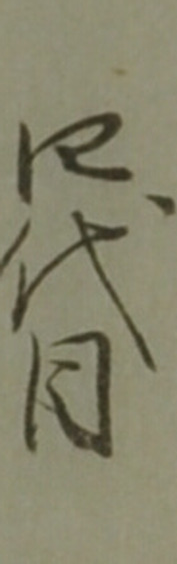四代目
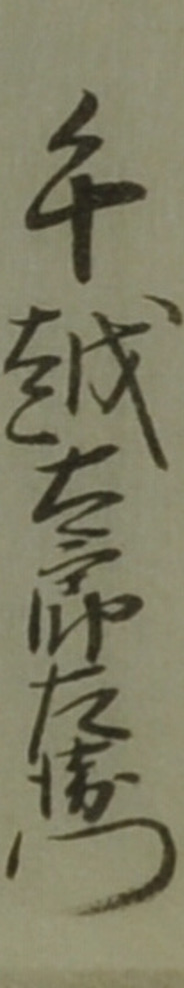手越太郎左衛門
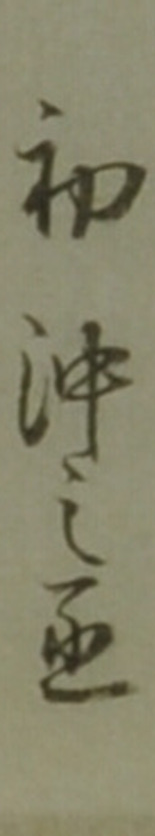初沖之丞
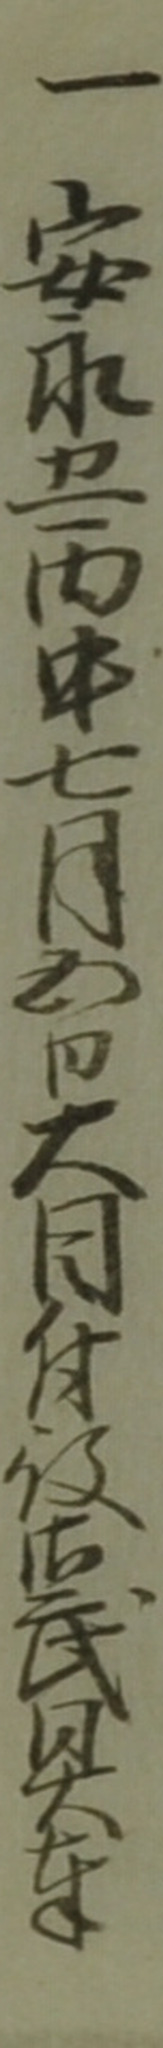一安永五丙申七月五日大目付役御武具奉
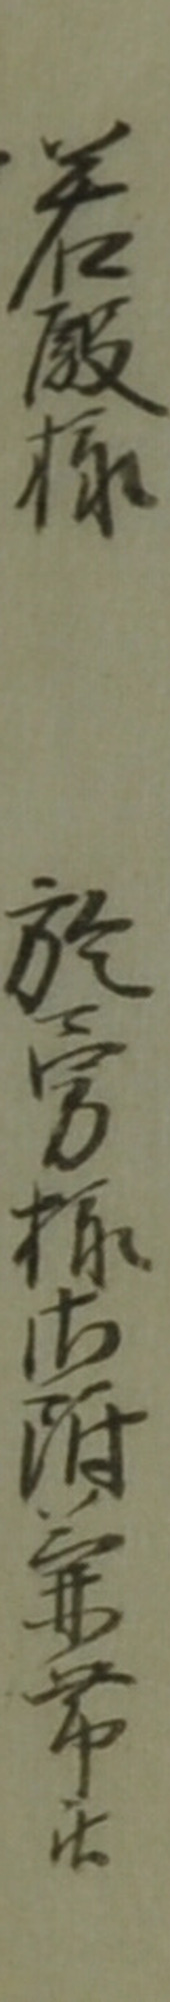若殿様於勇様御附兼帯被
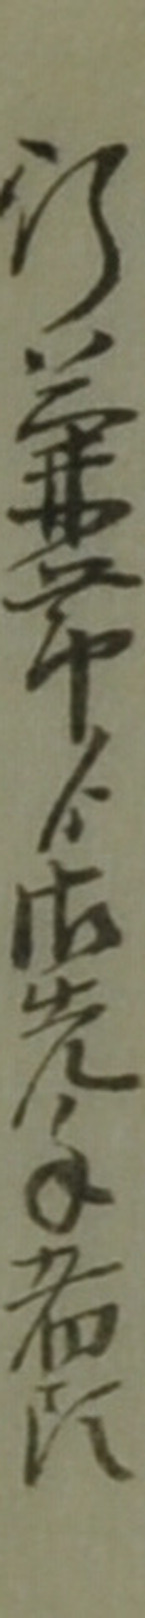行兼帯ゟ御先手者頭
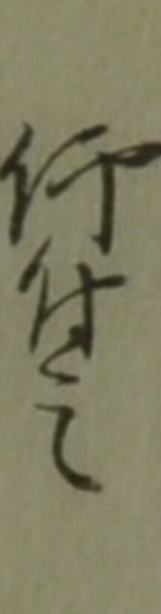仰付之
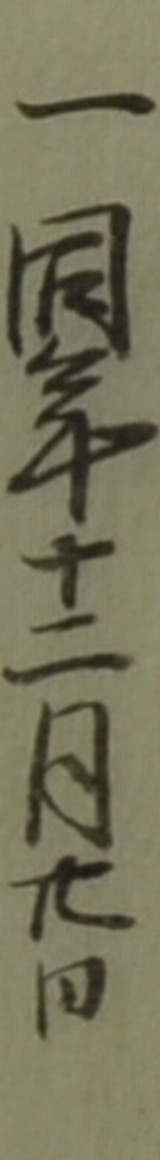一同年十二月廿日
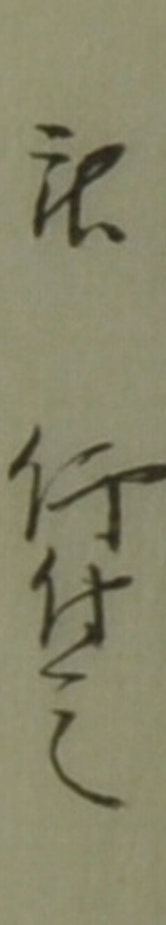被仰付之
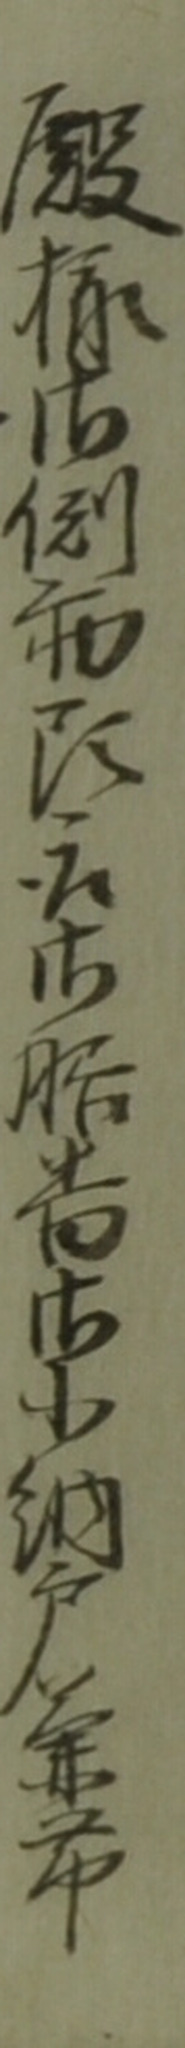殿様御側勤頭取御膳番御小納戸兼帯

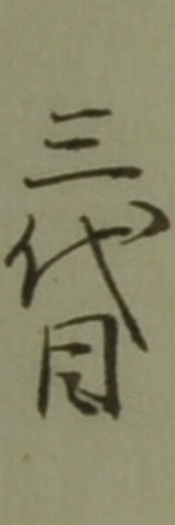三代目
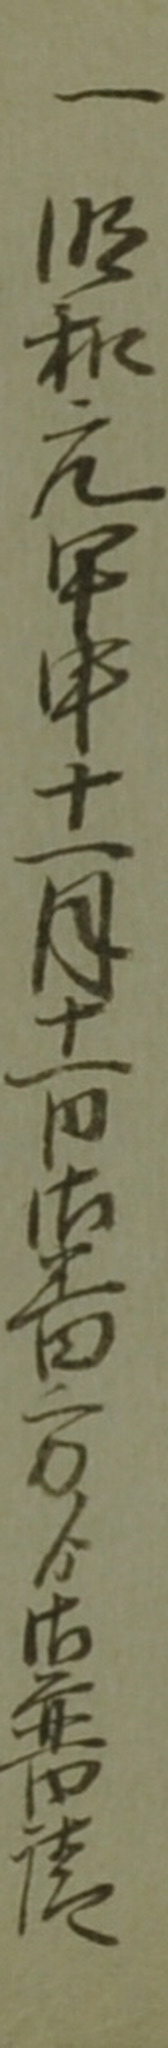一明和元甲申十一月十一日御番方ゟ御普請
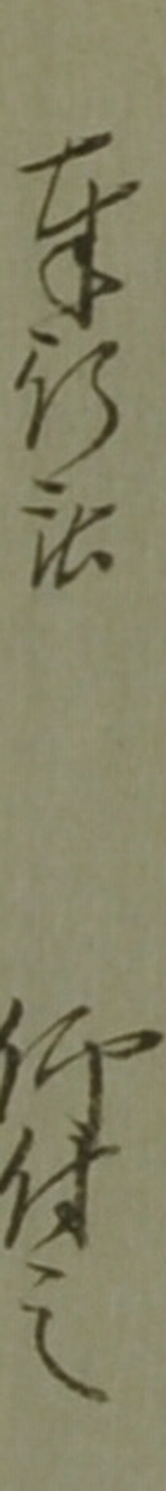奉行被仰付之
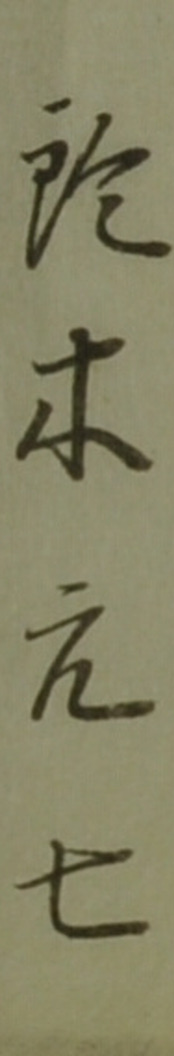鈴木元七
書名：諸御役代々録（六）
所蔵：伊那市立高遠町図書館・合同会社AMANE
